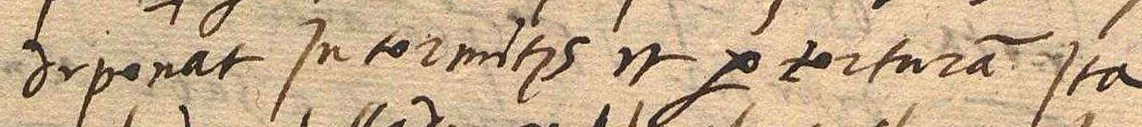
deponat Jn tormētjs et ꝑ torturā Jta
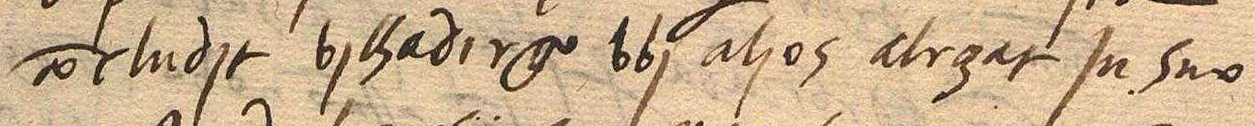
c̄ocludjt vilhadiego bbj alios alegat Jn suo
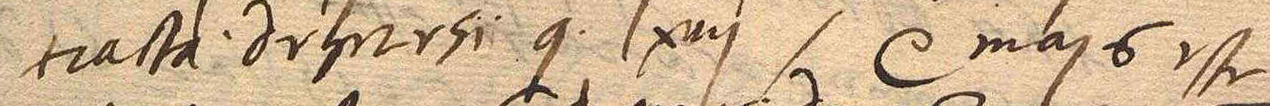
tracta de heresi q xiiij / e majs este
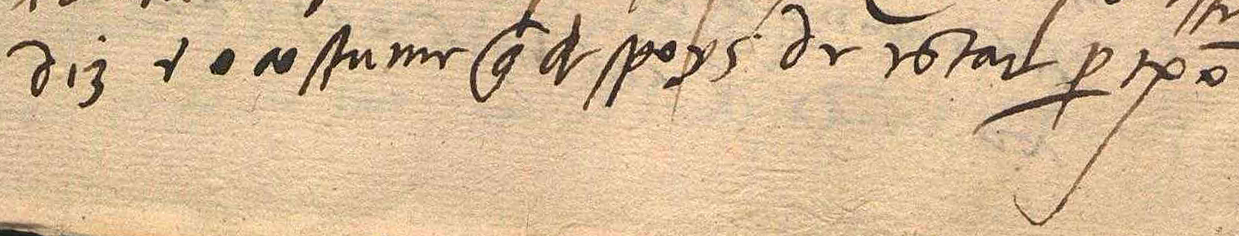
diz ē o costume q̄ despoys de estar ꝑ tpō
